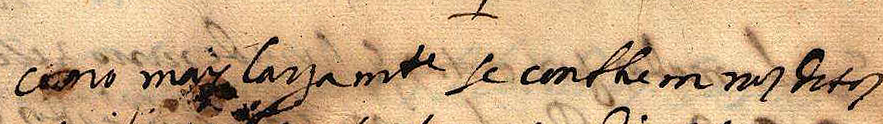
como mais largamte se conthem nos ditos
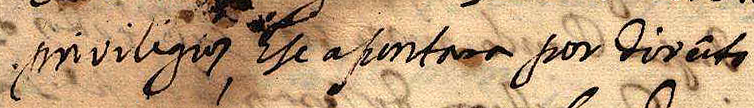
privilegios, E se apontara por direito
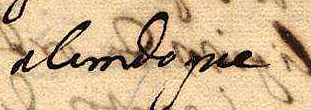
alem do que
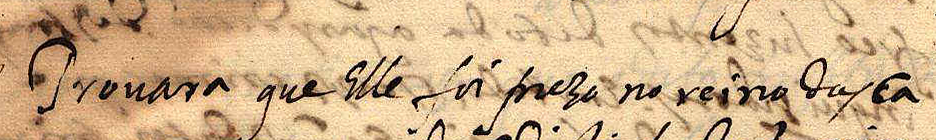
7 Prouara que Elle foi prezo no reino das ca
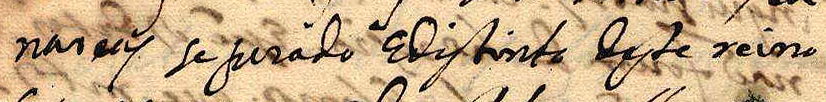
nareas seperado E distinto deste reino
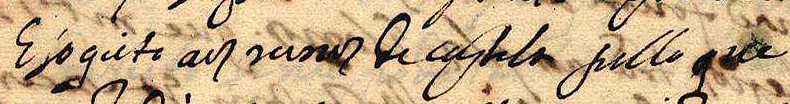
E sogeito aos nunes de castela pello que
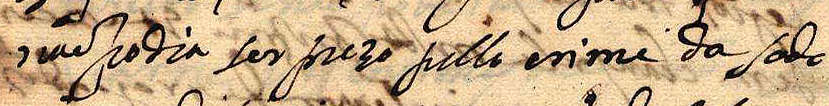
naõ podia ser prezo pello crime da Sodo
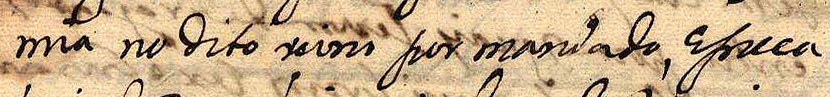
mia no dito reino por mandado, E preca
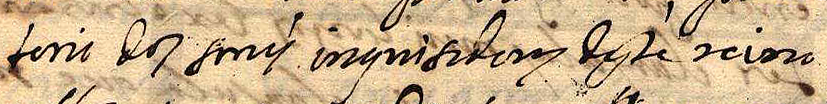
toria dos snres̄ inquisidores deste reino
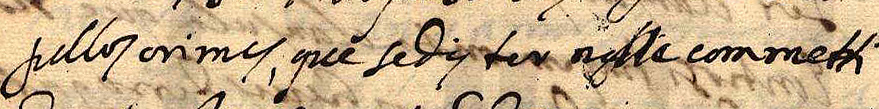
pellos crimes, que se dis ter nelle commetti
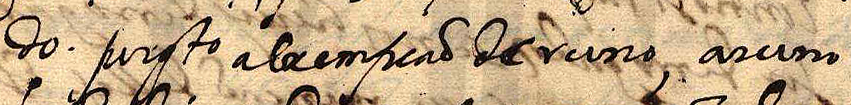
do. porqto a exempçaõ de reino, a reino
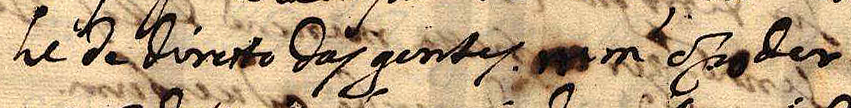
he de direito das gentes _m o poder
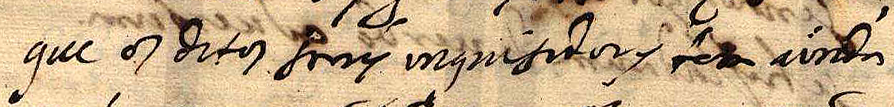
que os ditos snres̄ inquisidores tem ainda
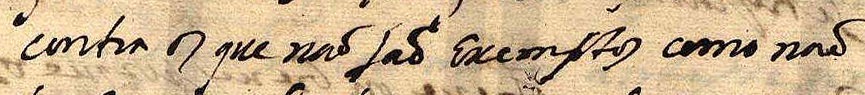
contra os que naõ saõ Exemplos como naõ
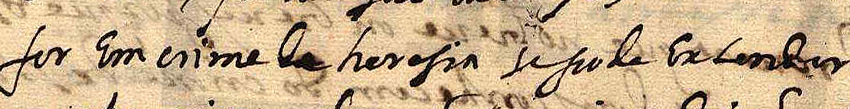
for Em crime da heresia se pode Extender
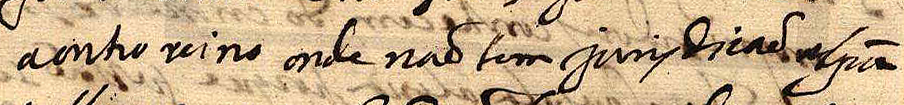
a outro reino onde naõ tem jurisdiçaõ alguā
